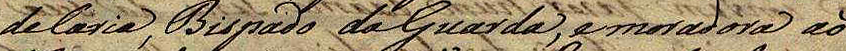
de Caria, Bispado da Guarda, e moradora aõ
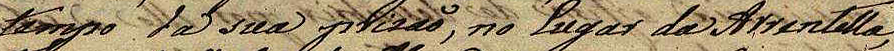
tempo da sua prizaõ, no Lugar da Arrentella,
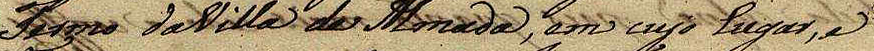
Termo da Villa de Almada, em cujo Lugar, e
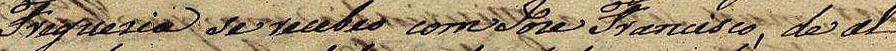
Freguezia se recebeu com Ioze Francisco, de al
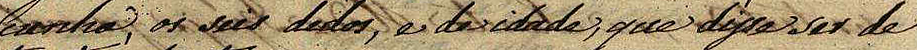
cunha, os seis dedos, e de idade, que disse ser de
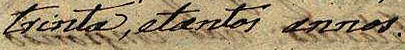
trinta, e tantos annos.
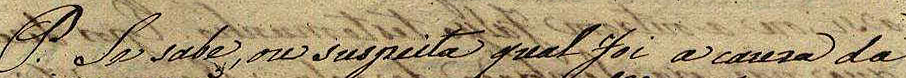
P. Se sabe, ou suspeita qual foi a cauza da
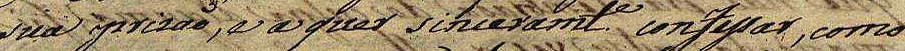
sua prizaõ, e a quer sinceramt.e confessar, como
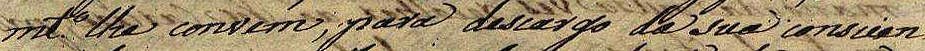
mt.o lhe convem, para descargo da sua conscien
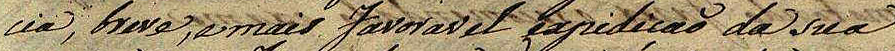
cia, breve, e mais favoravel expidiçaõ da sua
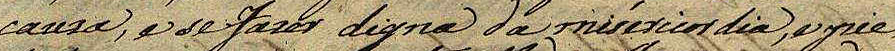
cauza, e se fazer digna da misericordia, e pie
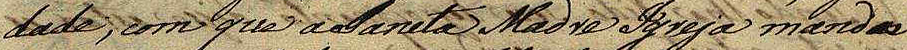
dade, com que a Sancta Madre Igreja manda
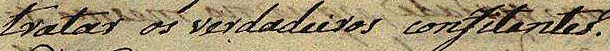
tratar os verdadeiros confitantes.
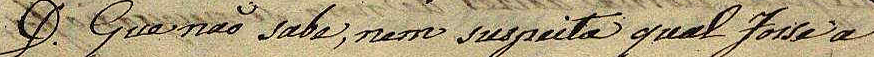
D. Que naõ sabe, nem suspeita qual fosse a
